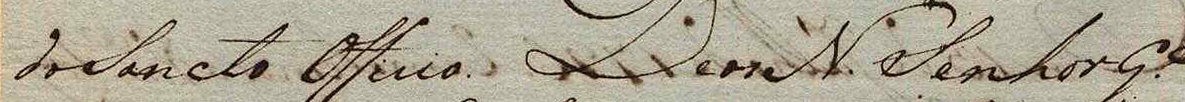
do Sancto Officio. Deos N. Senhor G.e
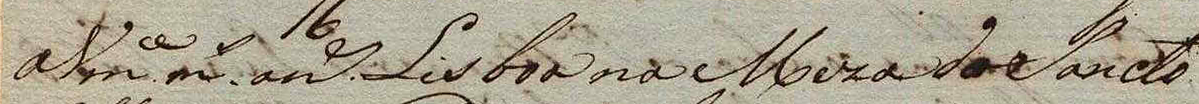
a Vm.ce m.s an.s Lisboa na Meza do Sancto
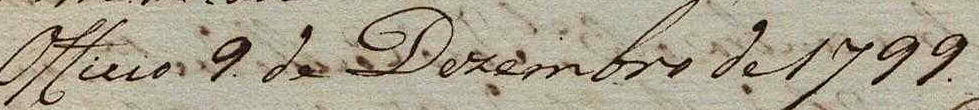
Officio 9. de Dezembro de 1799.
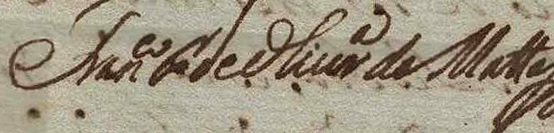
Franco Fr de Olivra da Matte
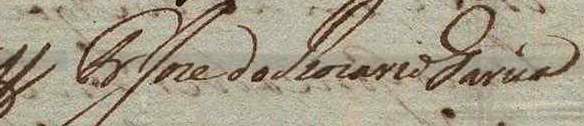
Fr Joze do Rozario Garcia
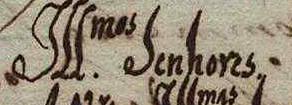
Ill.mos Senhores.
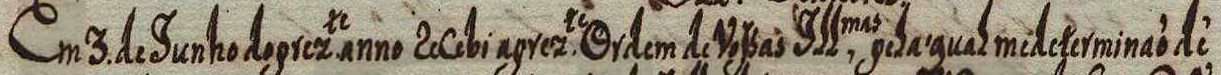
Em 3. de Junho do prez.te anno Recebi a prez.te Ordem de Vossas Illmas, pela qual me determinaõ dé
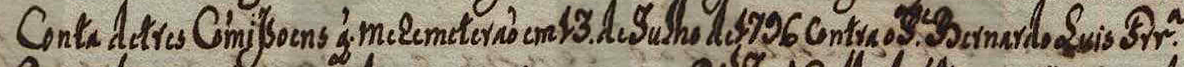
Conta de tres Com̄issoens, q̄ me Remeteraõ em 13 de Iulho de 1796 Contra o P.e Bernardo Luis Frr.a
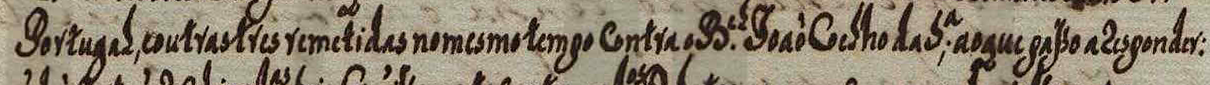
Portugal, e outras tres remetidas no mesmo tempo contra o B.el Ioaõ Coelho da S.a, ao que passo a Responder:
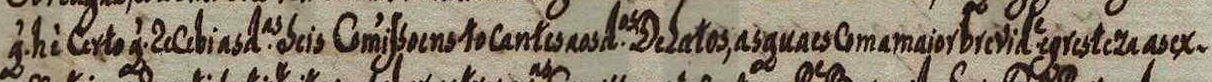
q̄ hé certo q̄ Recebi as d.as seis Comissoens tocantes aos d.os Delatos, as quaes com a maior brevide e presteza as ex
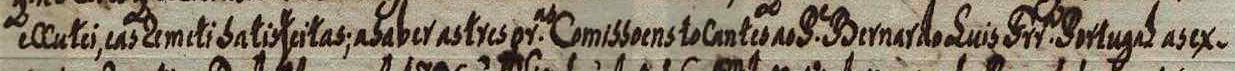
eCCutei; e as Remiti satisfeitas, a saber as tres pr.as Comissoens tocantes ao P.e Bernardo Luis Frr.a Portugal as ex
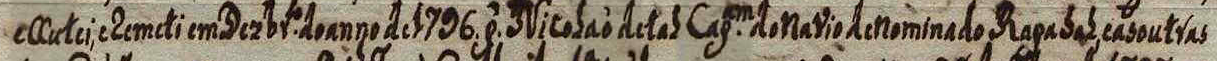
eCCutei, e Remeti em Dezbr.o do anno de 1796 p̄ Nicolaõ de tal Cap.am do navio denominado Rapasal e as outras
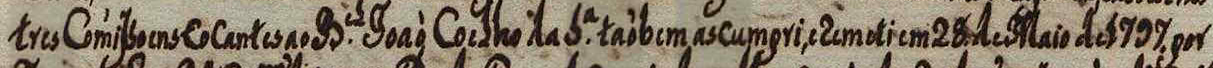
tres Comissoens toCantes ao B.el Ioaõ Coelho da S.a taõbem as cumpri, e Remeti em 28. de Maio de 1797. por
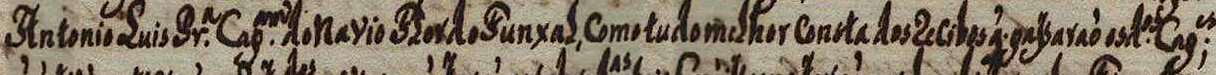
Antonio Luis Pr.a Cap.am do Navio Bordo Funxal, como tudo melhor consta dos Recibos q̄ passaraõ os d.os Cap.es;
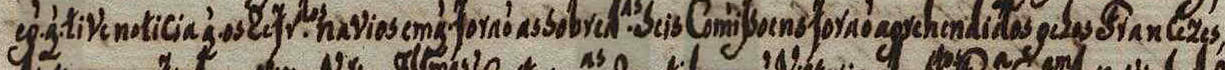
e p̄ q̄ tiVe noticia q̄ os Refr.dos naVios em q̄ foraõ as sobred.as seis Comissoens foraõ aprehendidos pelos FranCeZes,
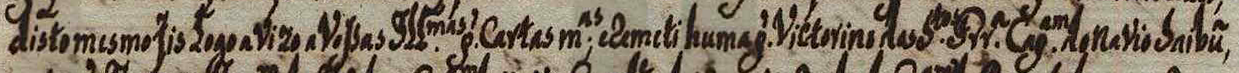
disto mesmo fis Logo avizo a Vossas Ill.mas p̄ Cartas m.as e Remeti huma q̄ Victorino das S.tos Frr.a Cap.am do navio saibū,
